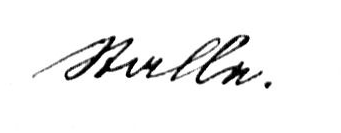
Stalle.
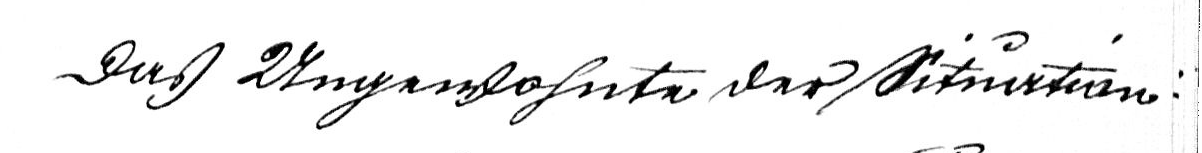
Das Ungewohnte der Situation
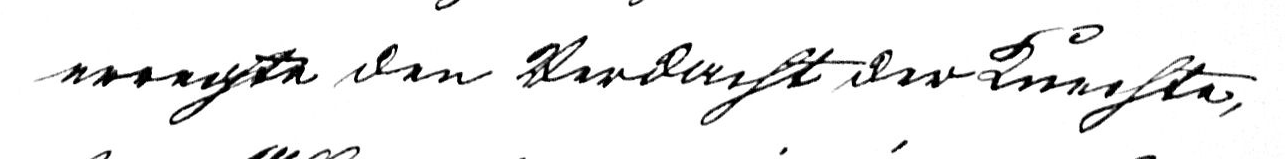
erregte den Verdacht der Knechte,
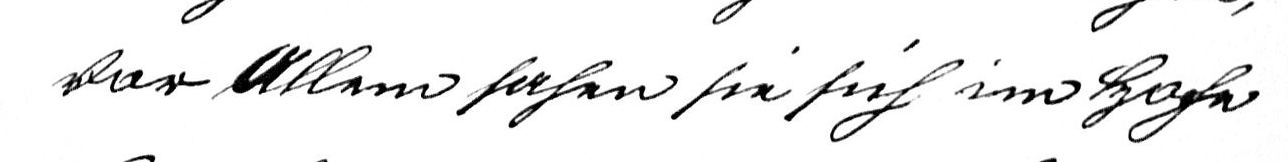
vor Allem sahen sie sich im Hofe
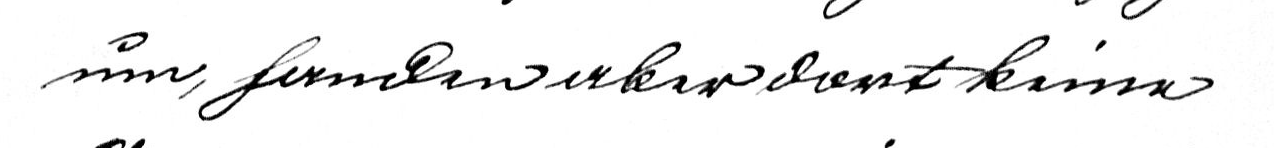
um, fanden aber dort keine
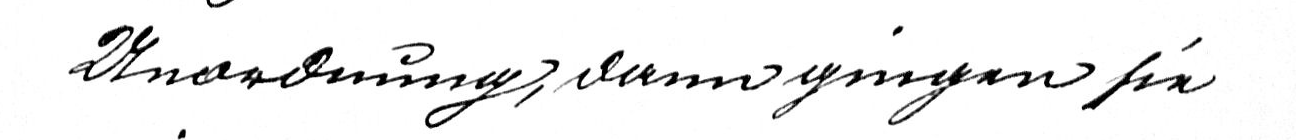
Unordnung, dann gingen sie
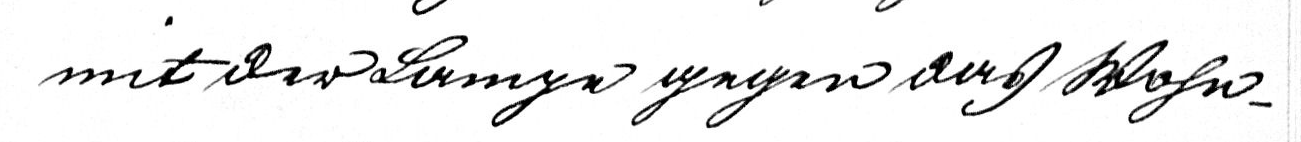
mit der Lampe gegen das Wohn¬
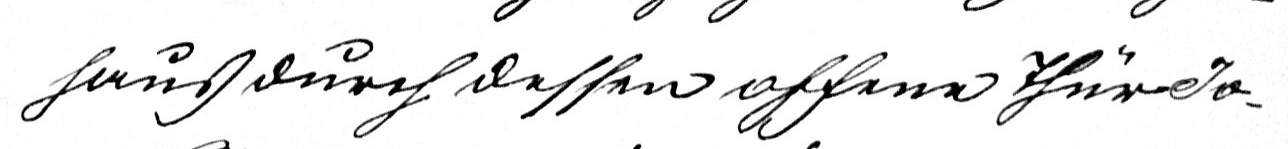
haus durch dessen offene Thür Jo¬
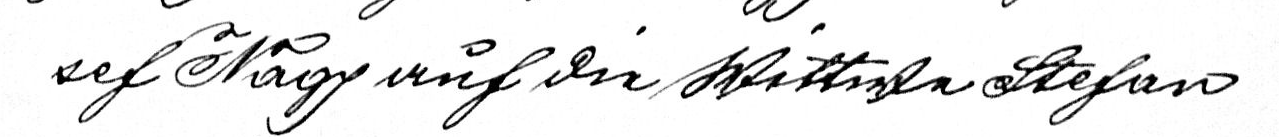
sef Nagy auf die Wittwe Stefan
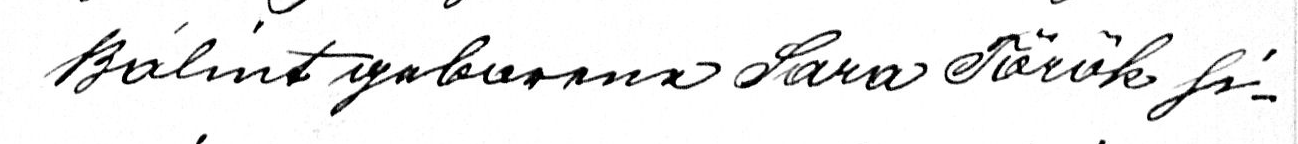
Bálint geborene Sara Török hi¬
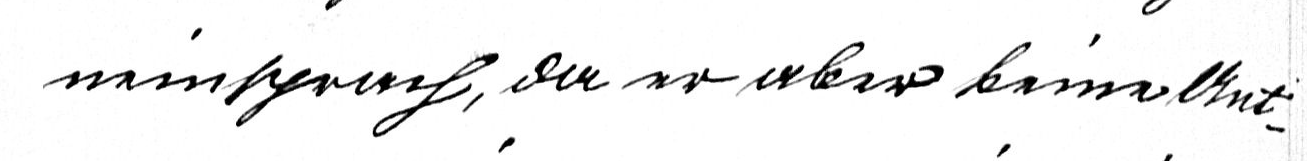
neinsprach, da er aber keine Ant¬
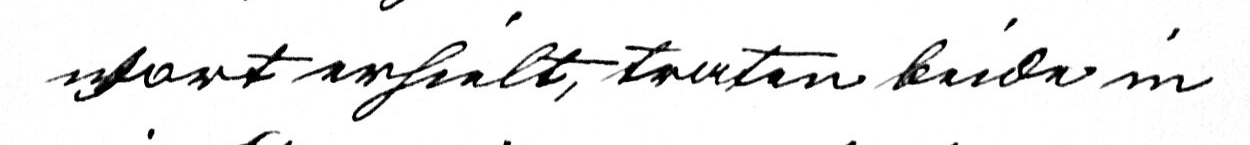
wort erhielt, traten beide in
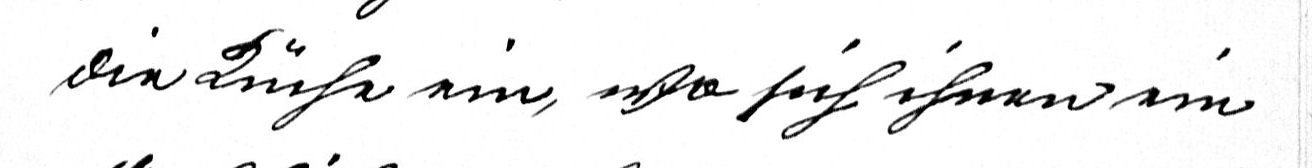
die Küche ein, wo sich ihnen ein
